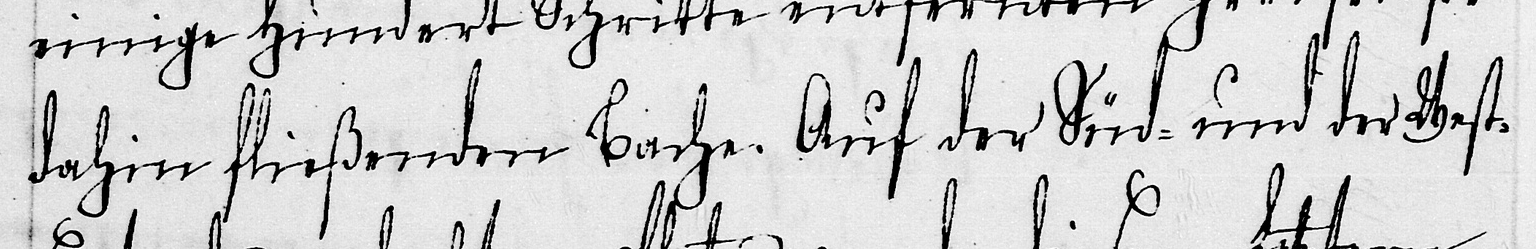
dahin fließenden Bache. Auf der Süd- und der West¬
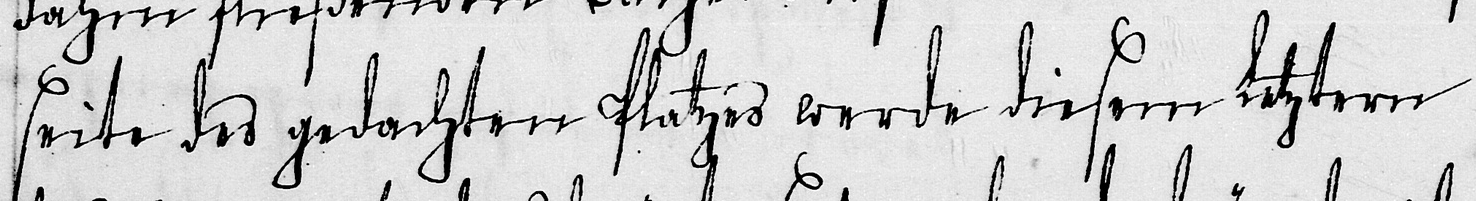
seite des gedachten Platzes werde diesem Letztern
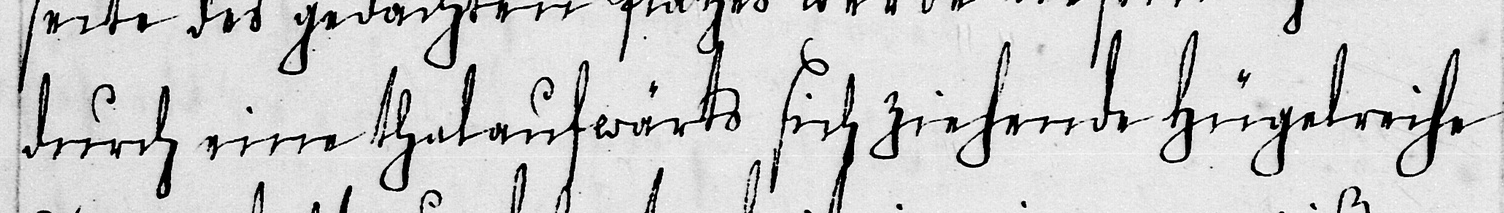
durch eine thalaufwärts sich ziehende Hügelreihe
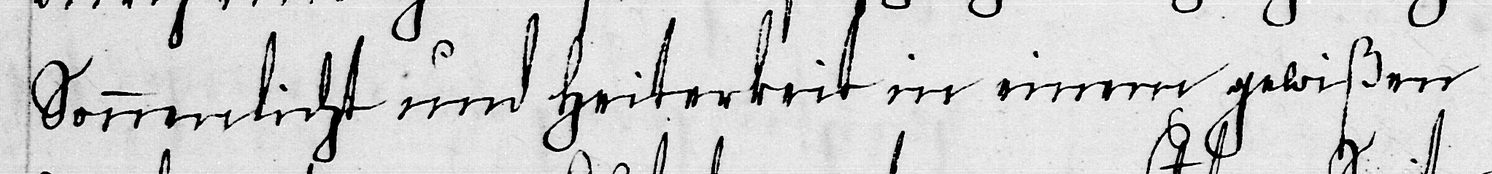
Sonnenlicht und Heiterkeit in einem gewißen
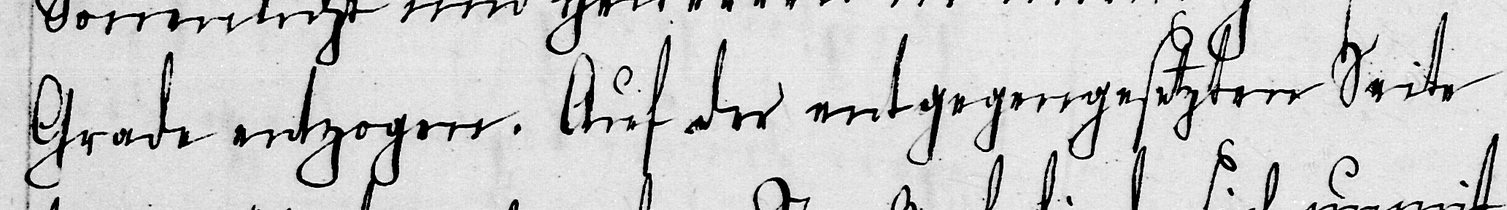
Grade entzogen. Auf der entgegengesetzten Seite
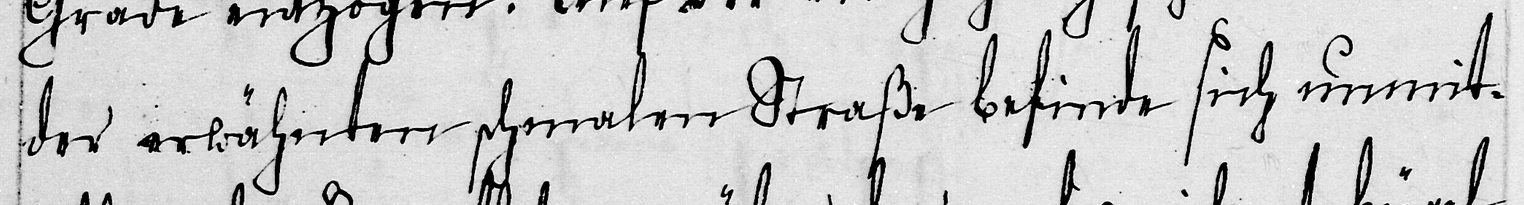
der erwähnten schmalen Straße befinde sich unmit¬
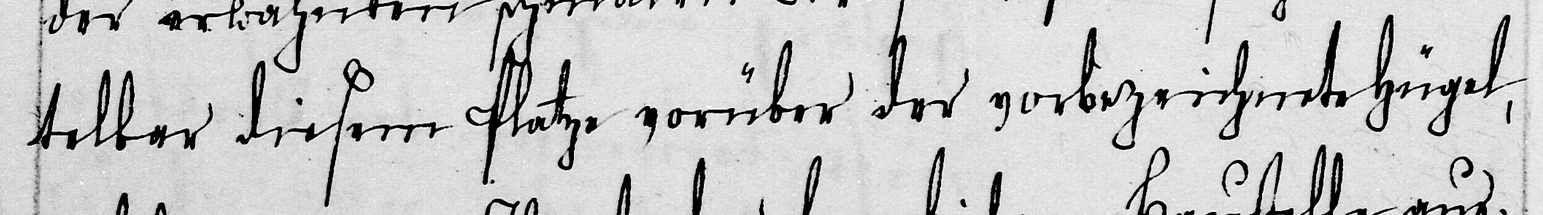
telbar diesem Platze vorüber der vorbezeichnete Hügel,
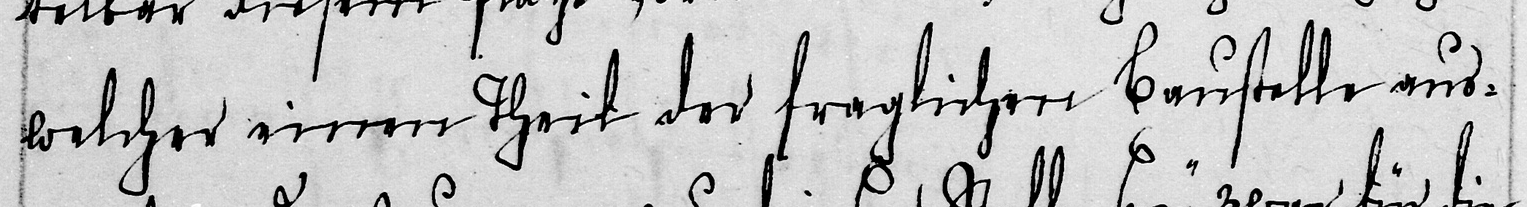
welcher einen Theil der fraglichen Baustelle aus¬
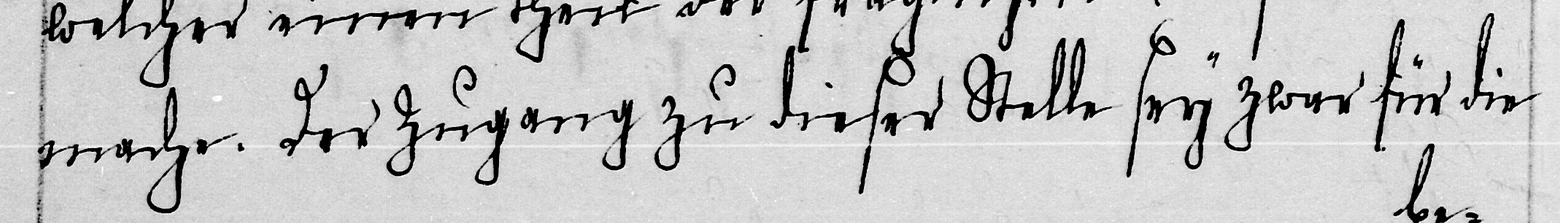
mache. Der Zugang zu dieser Stelle sey zwar für die
